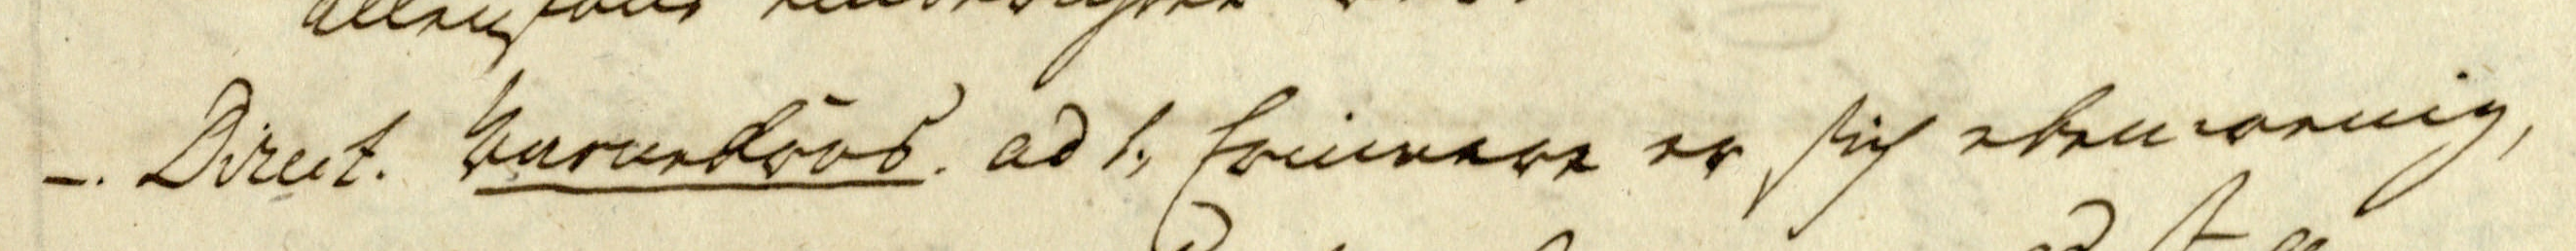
Direct. Warnekros. ad 1, Erinnere er sich eben wenig,
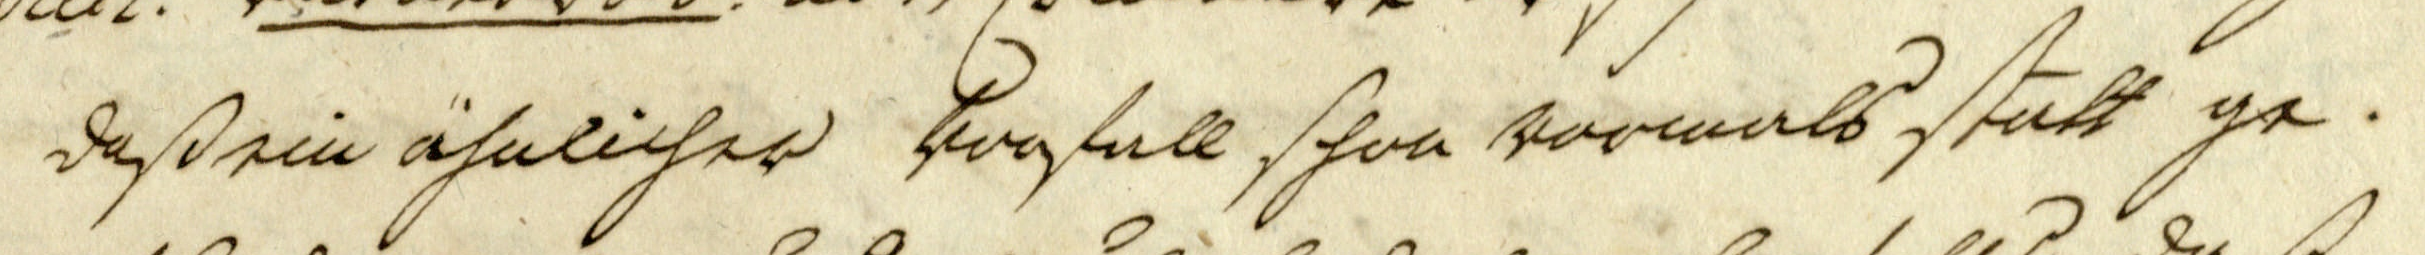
daß ein ähnlicher Vorfall schon vormals statt ge¬
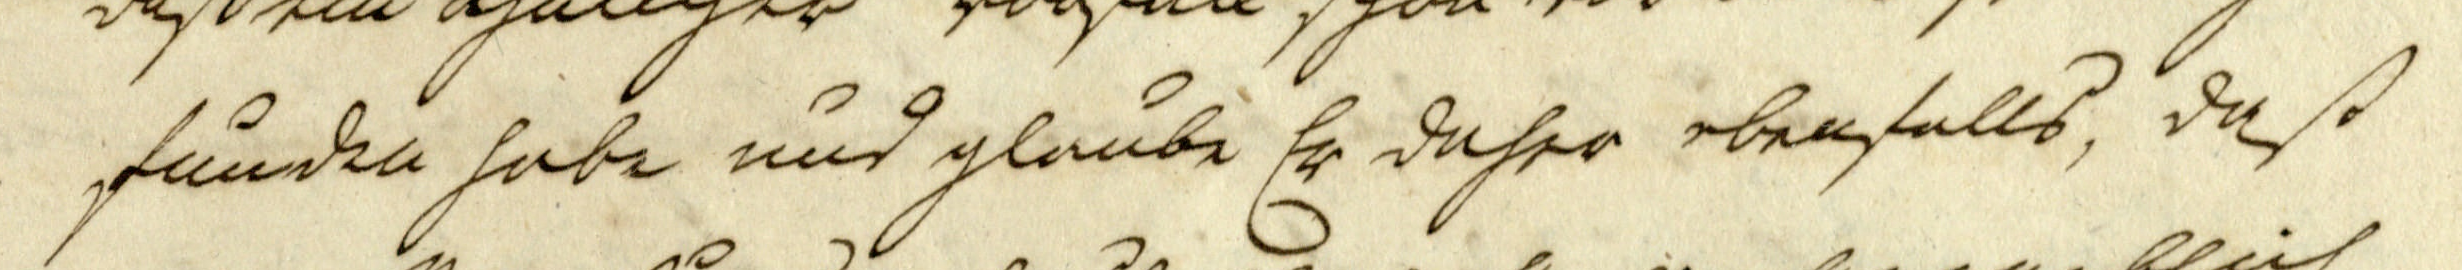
funden habe und glaube Er daher ebenfalls, daß
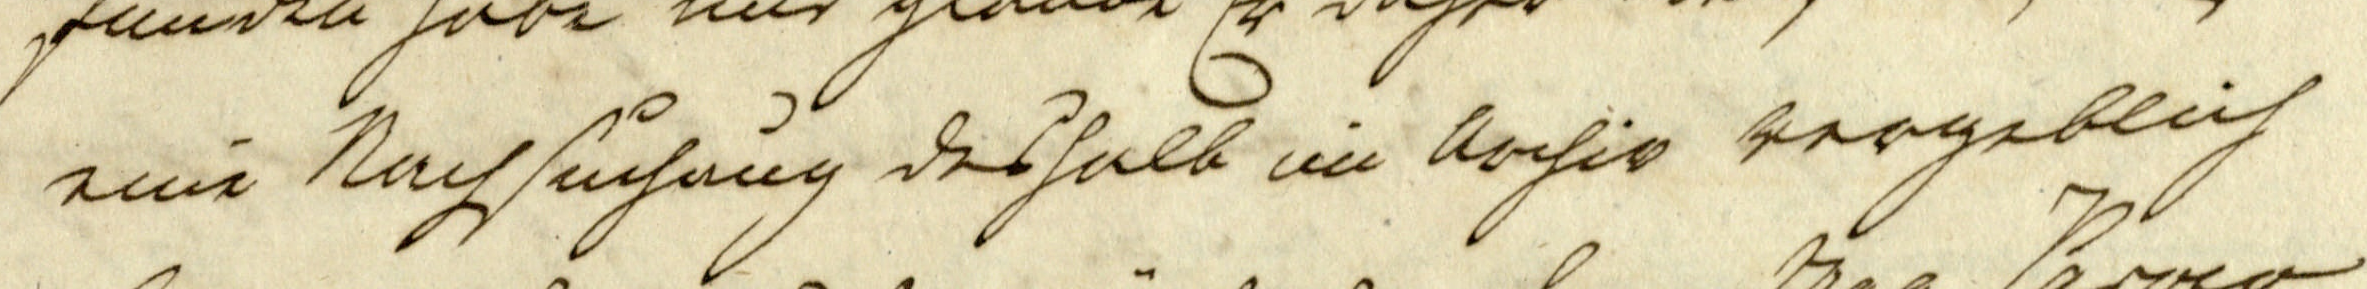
eine Nachsuchung deshalb im Archiv vergeblich
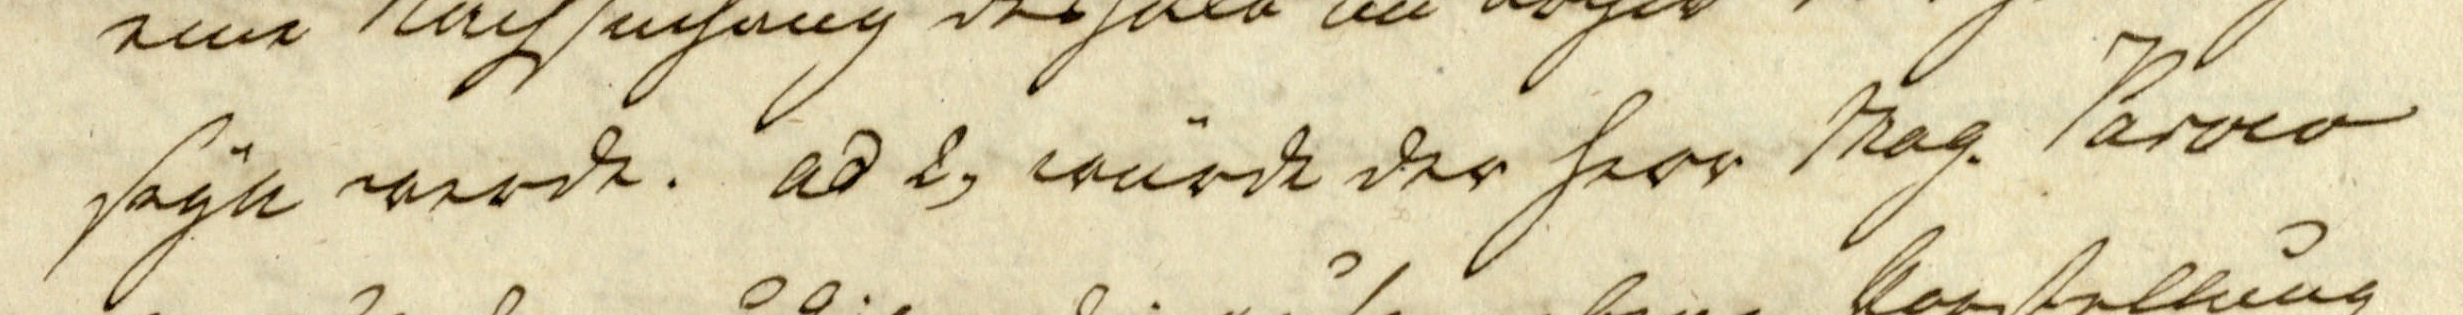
seÿn werde. ad 2, würde der herr Mag. Parow
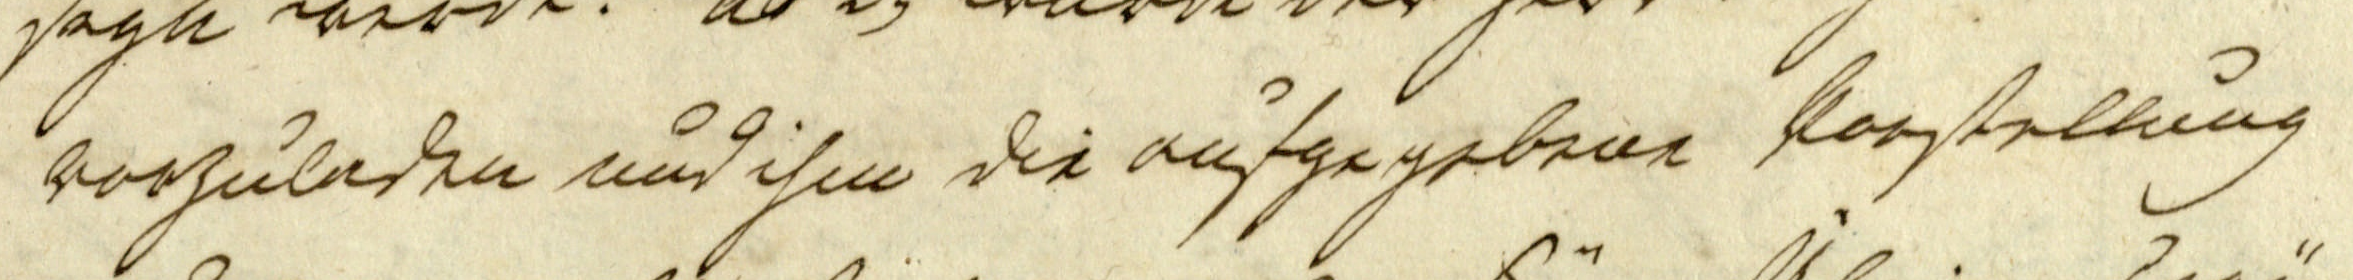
vorzuladen und ihm die aufgegebene Vorstellung
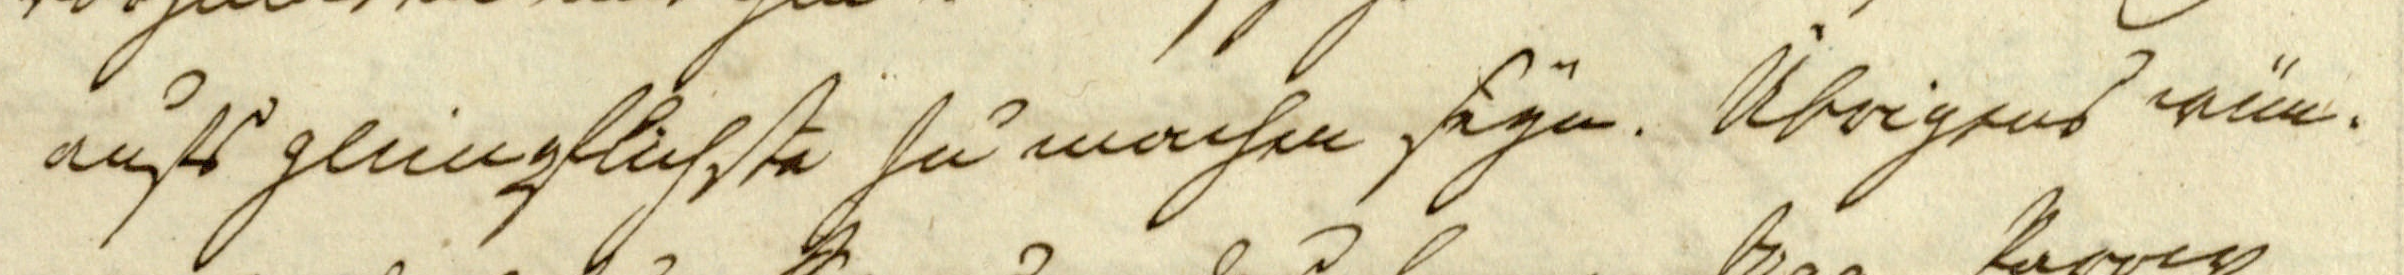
aufs glimpflichste zu machen seÿn. Überigens wün¬
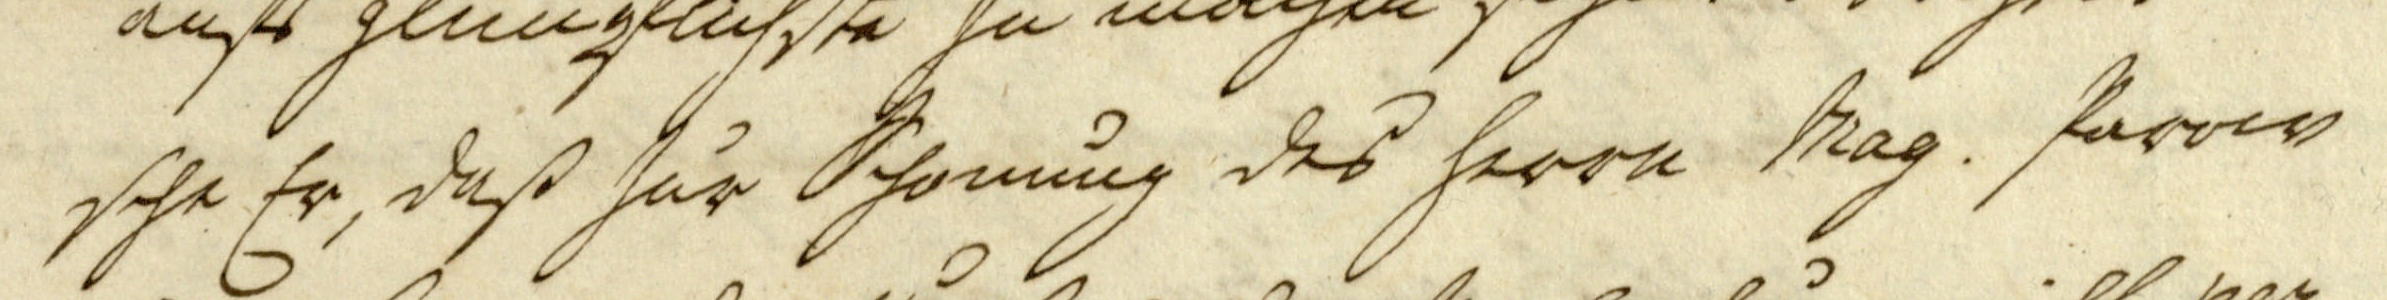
sche Er, daß zur Schonung des herrn Mag. Parow
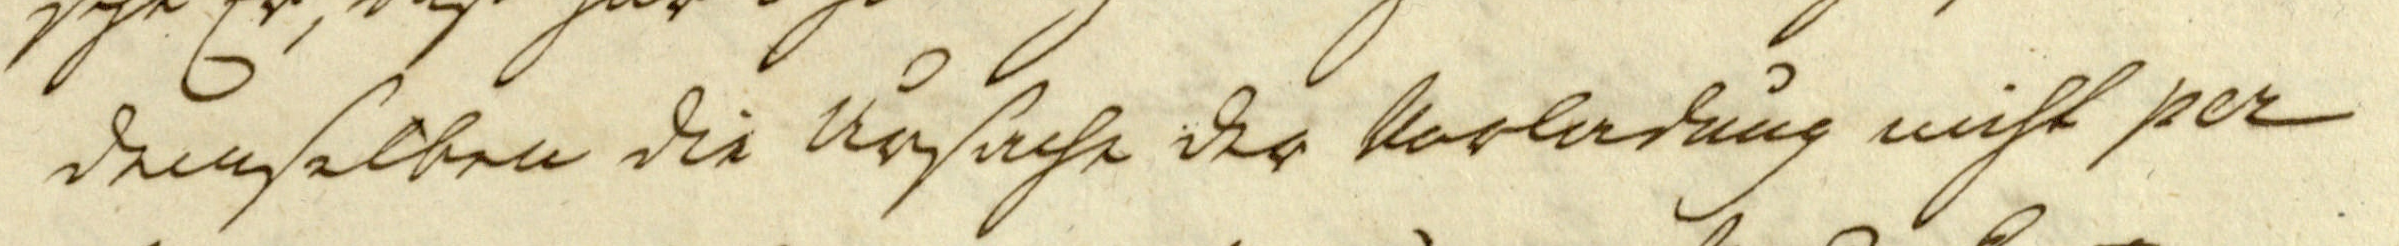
demselben die Ursache der Vorladung nicht per
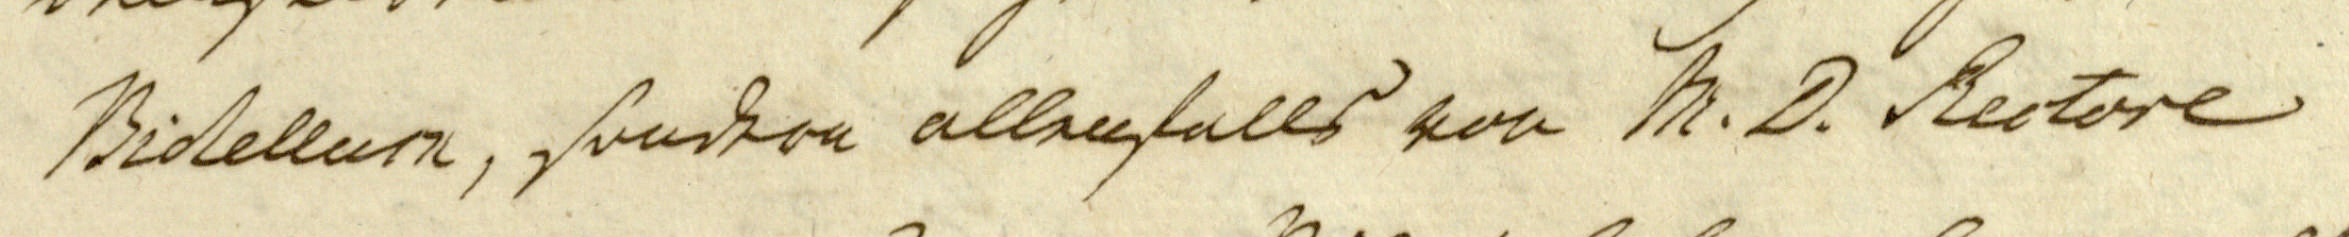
Bidellum, sondern allenfalls von M. D. Rectore
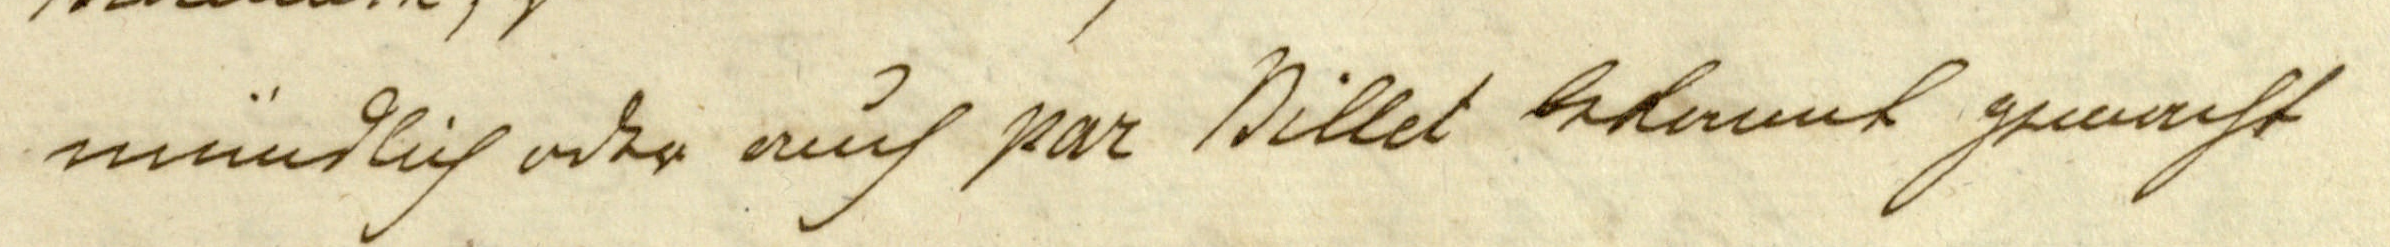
mündlich oder auch par Billet bekannt gemacht
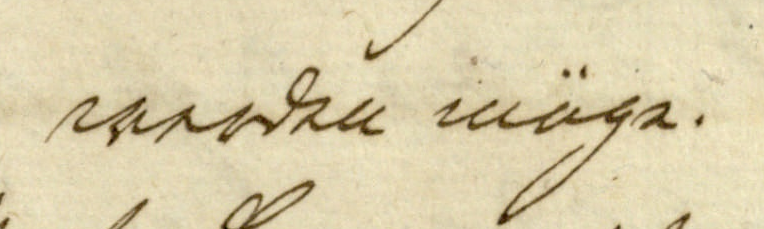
werden möge.
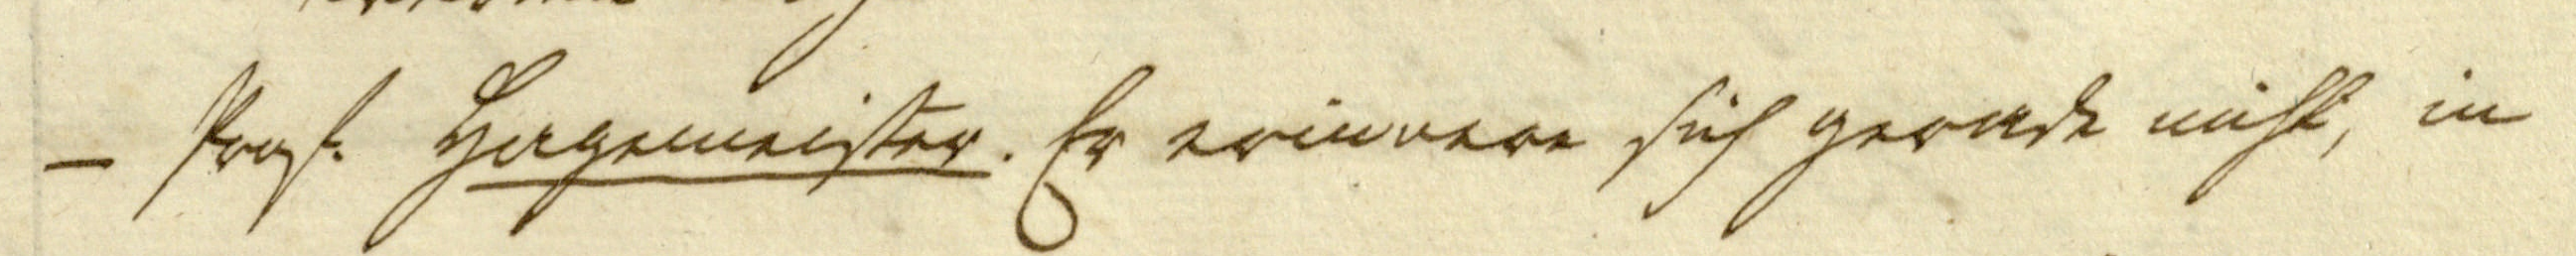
Prof. Hagemeister. Er erinnere sich gerade nicht, in
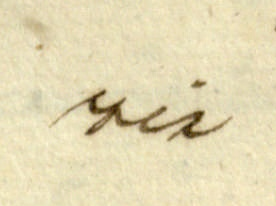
wie
